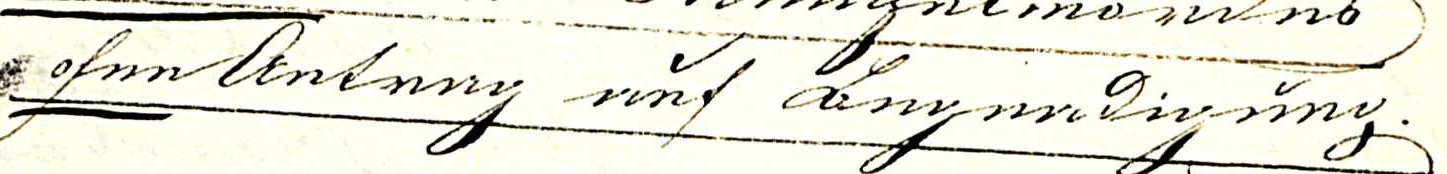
ohne Antrage auf Begnadigung
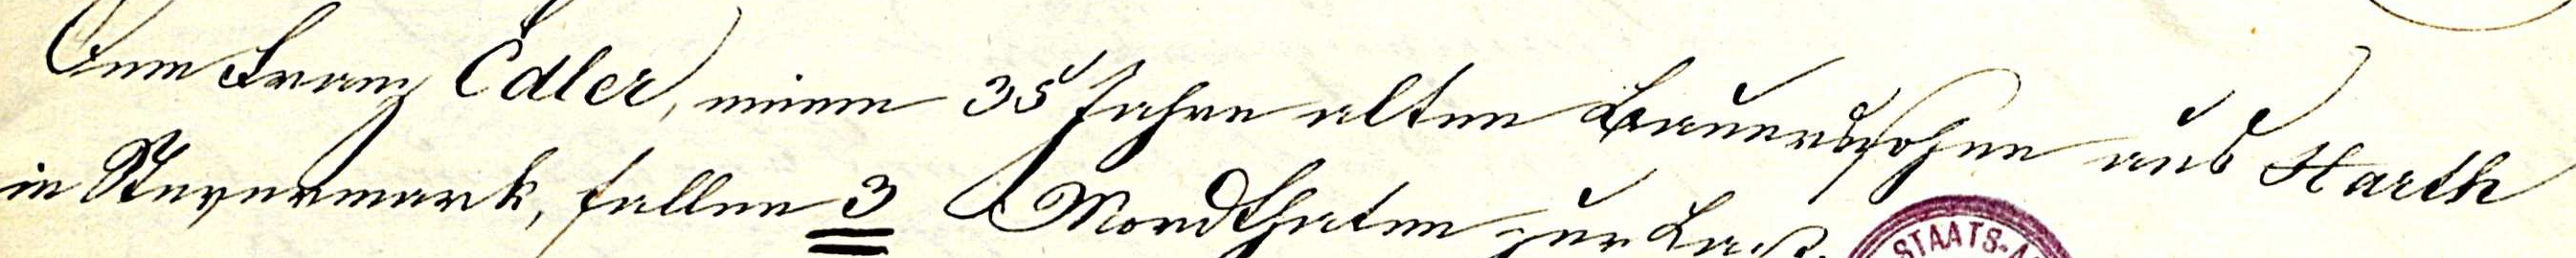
Dem Franz Edler, einen 35 Jahre alten Bauerssohne aus Harth
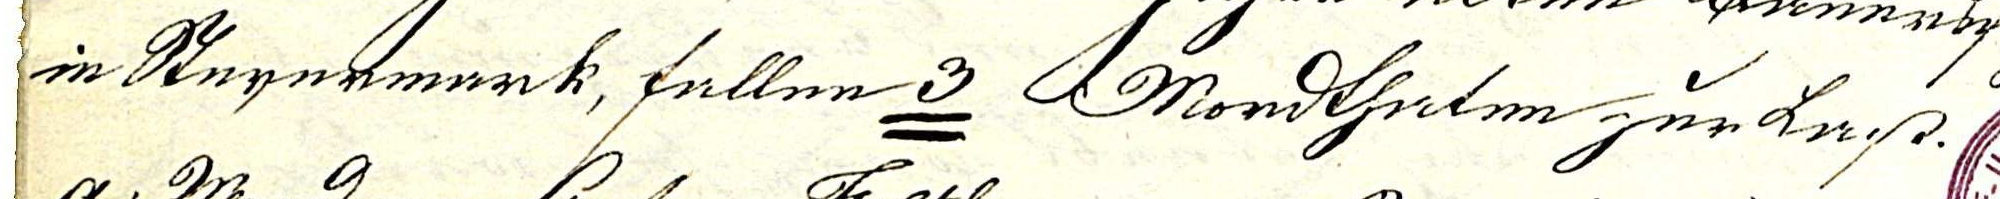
in Steyermark, fallen 3 Mordthaten zur Last.
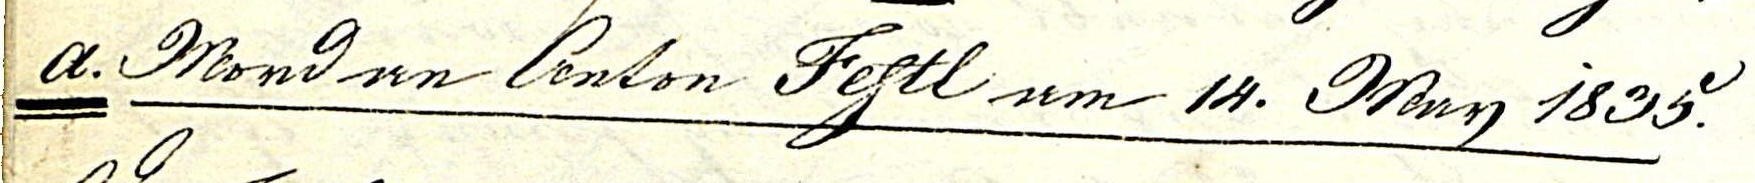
a. Mord an Anton Festl am 14. May 1835
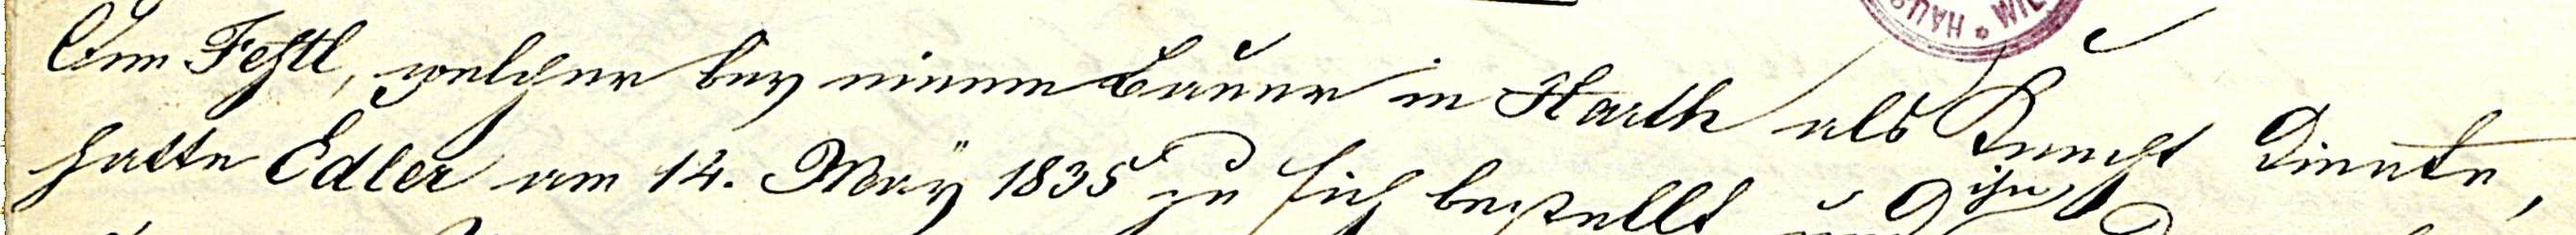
Den Festl, welcher bey einem Bauer in Harth als Knecht diente,
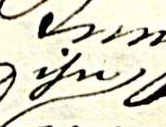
ihn
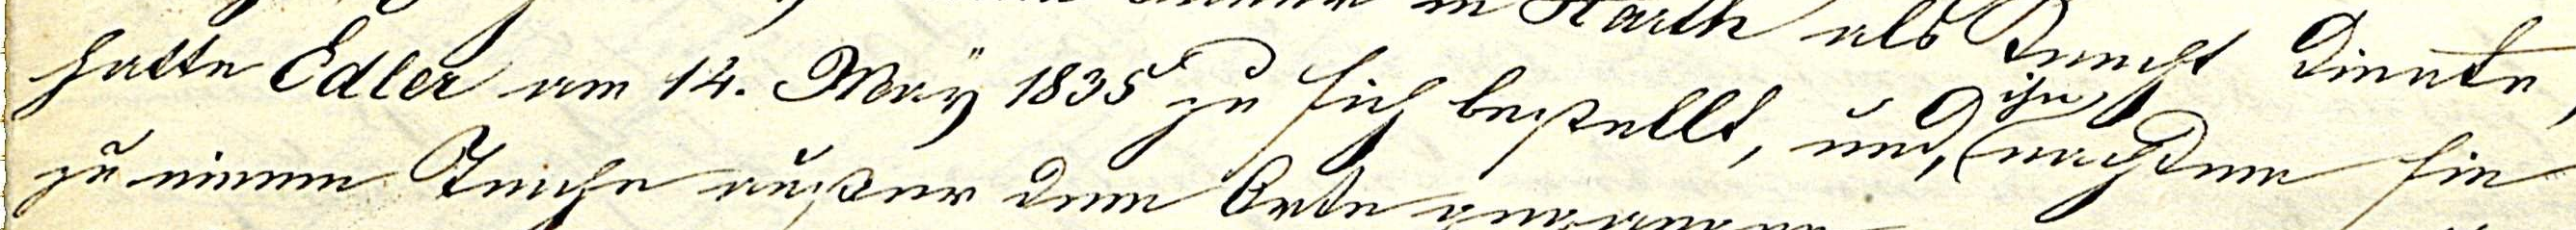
hatte Edler am 13. May 1835 zu sich bestellt, und nachdem sie
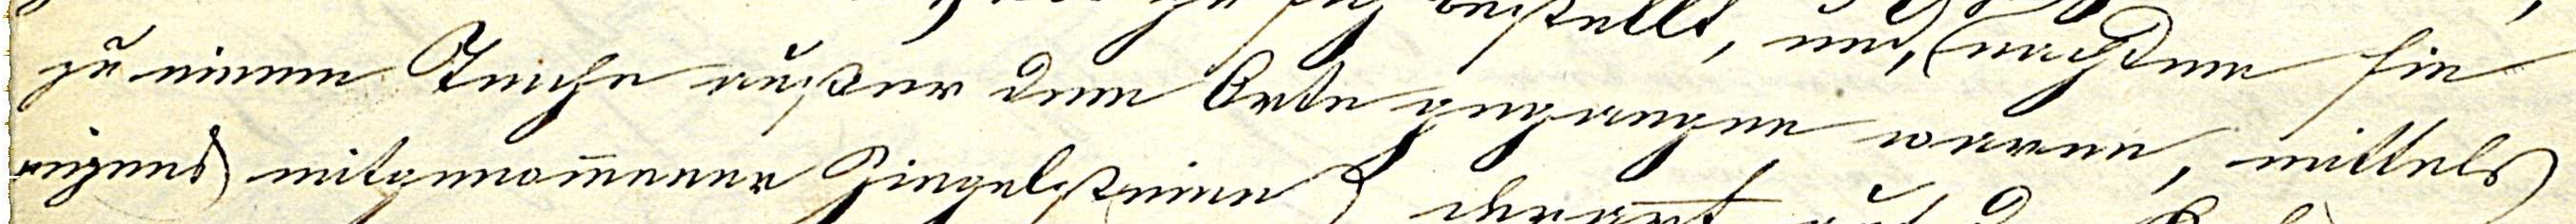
zu einem Teiche außer dem Orte gegangen waren, mittels
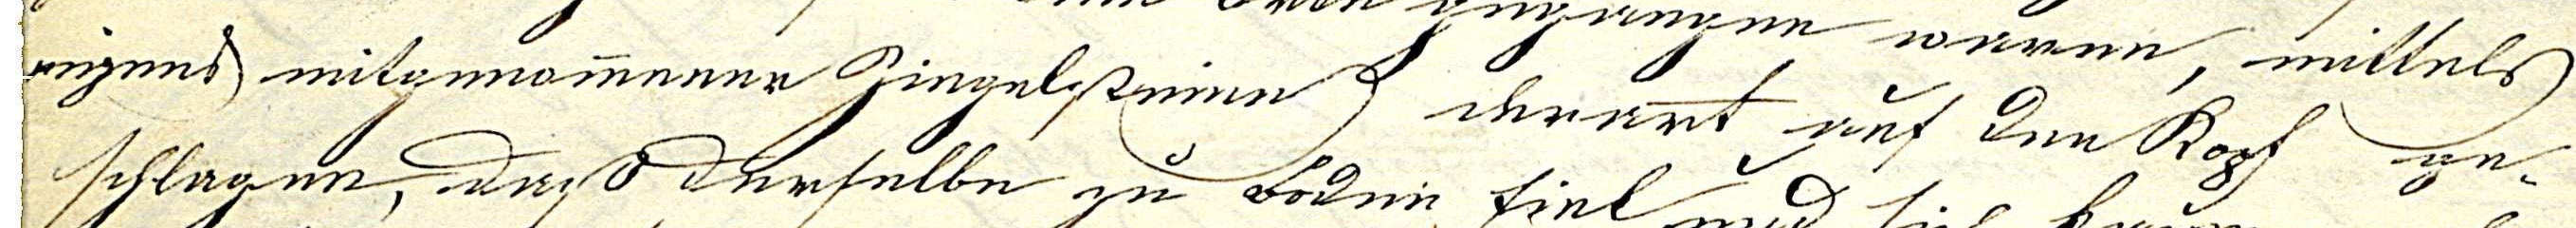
eigens mitgenommener Ziegelstein derart auf den Kopf ge¬
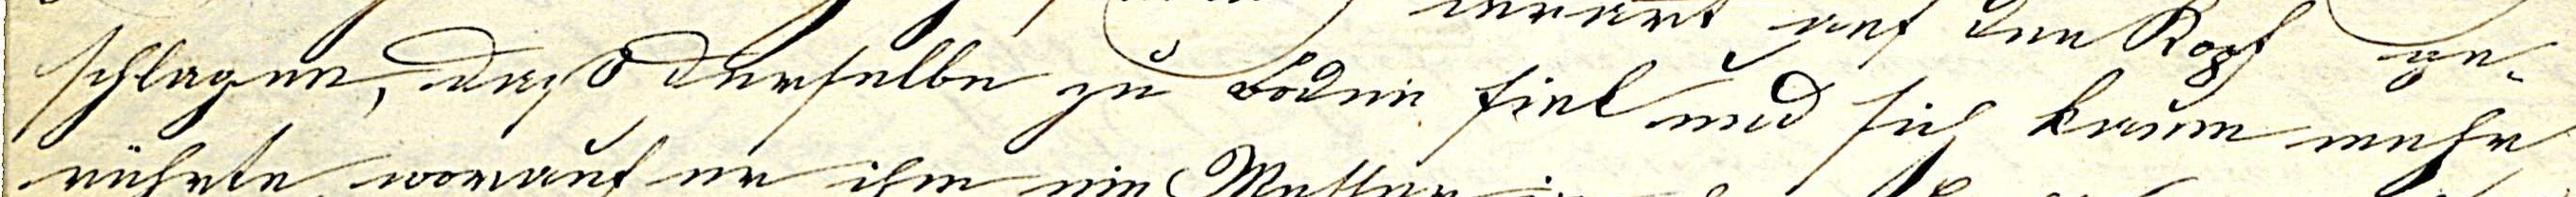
schlagen, daß derselbe zu Boden fiel und sich kaum mehr
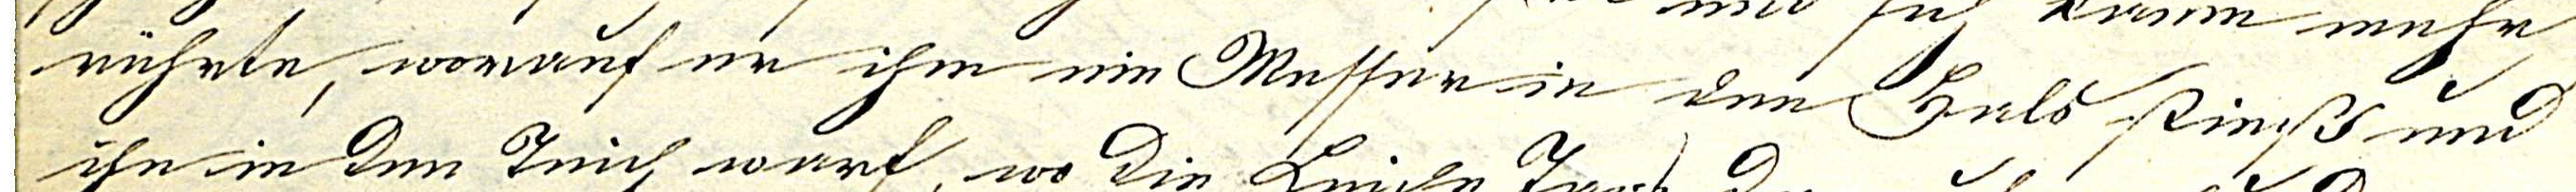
rührte, worauf er ihm ein Messer in den Hals stieß und
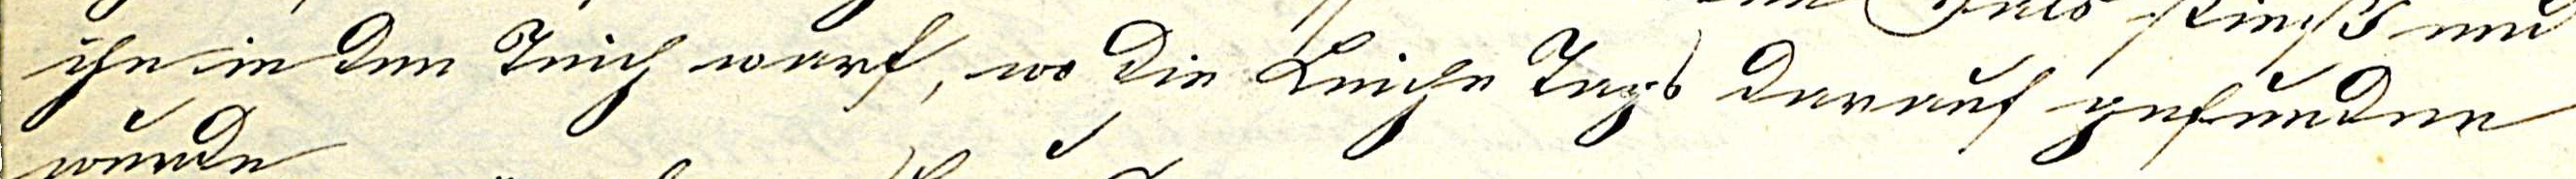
ihn in dem Teich warf, wo die Leiche Tags darauf gefunden
